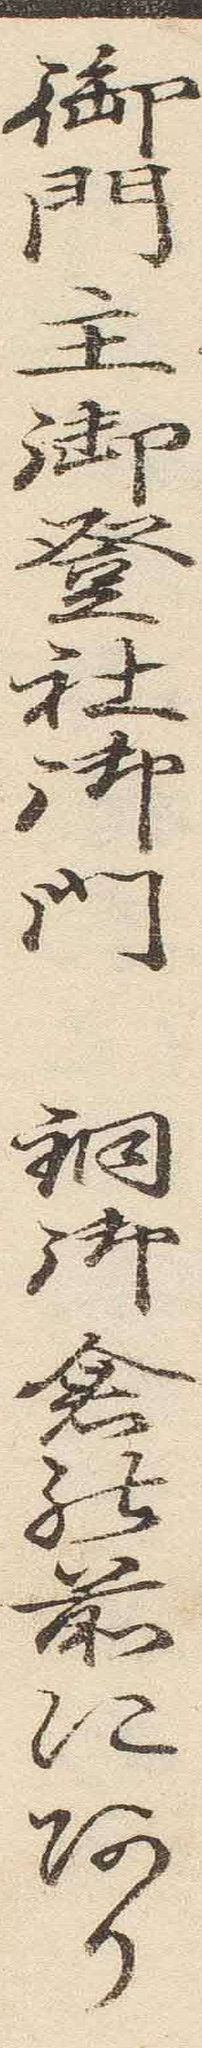御門主御登社御門銅御倉の前にあり
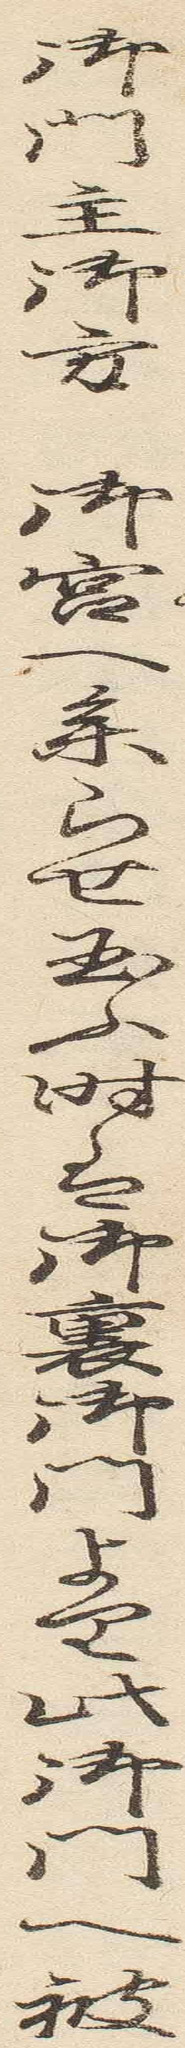御門主御方御宮へ参らせ玉ふ时は御裏御門より此御門へ被
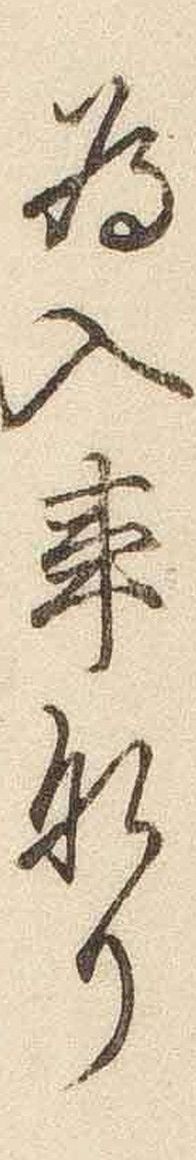為入事なり
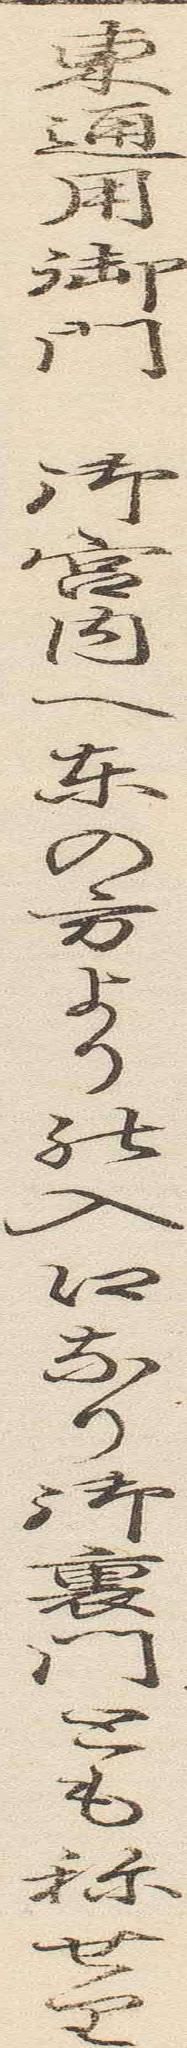東通用御門御宮内へ東の方よりの入口なり御裏門とも称せり
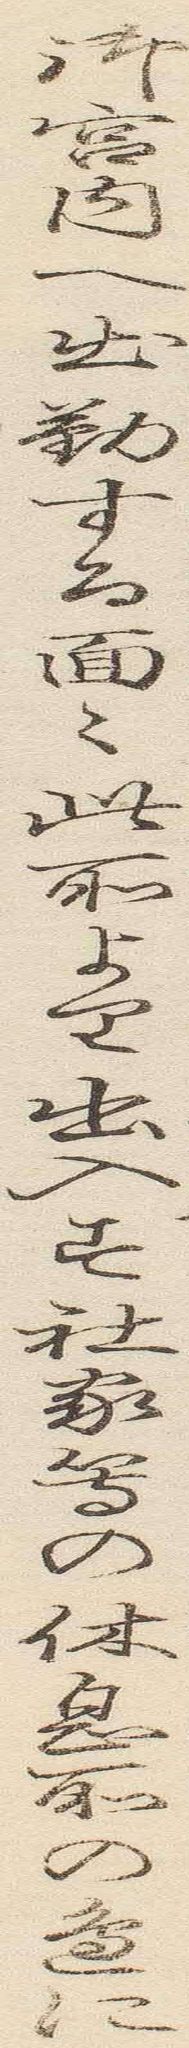御宮内へ出勤する面〻此所より出入す社家等の休息所の邊に
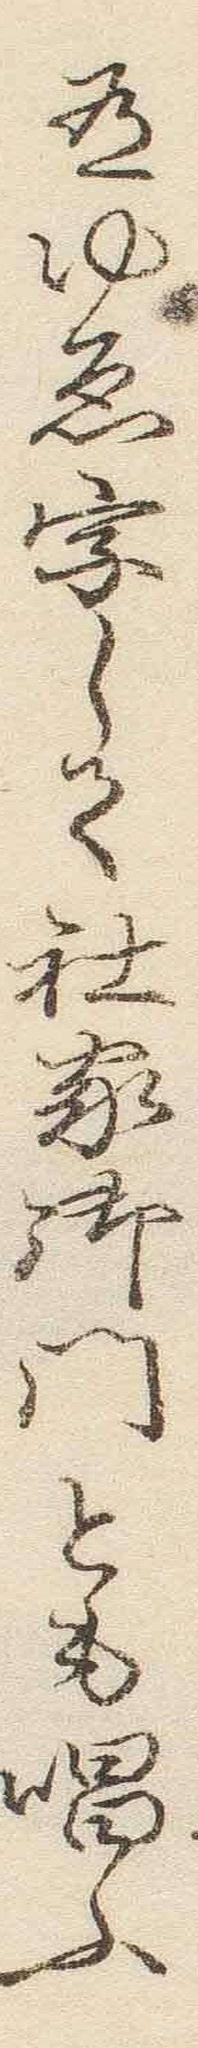有ゆゑ字して社家御門とも唱ふ
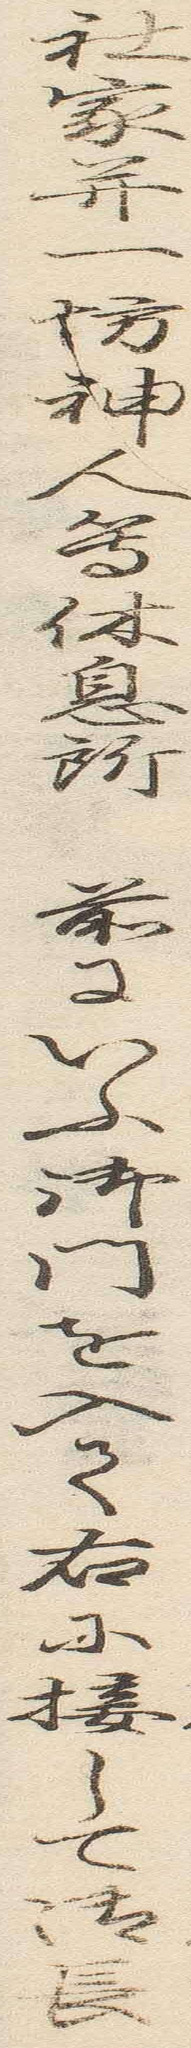社家并一坊神人等休息所前にいふ御門を入て右に接して御長
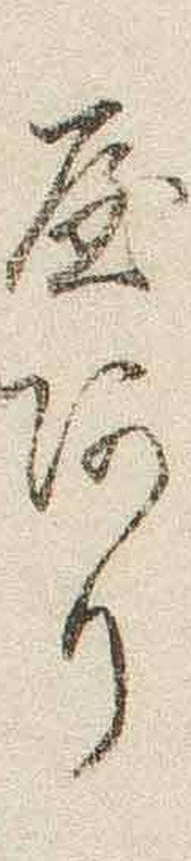屋あり
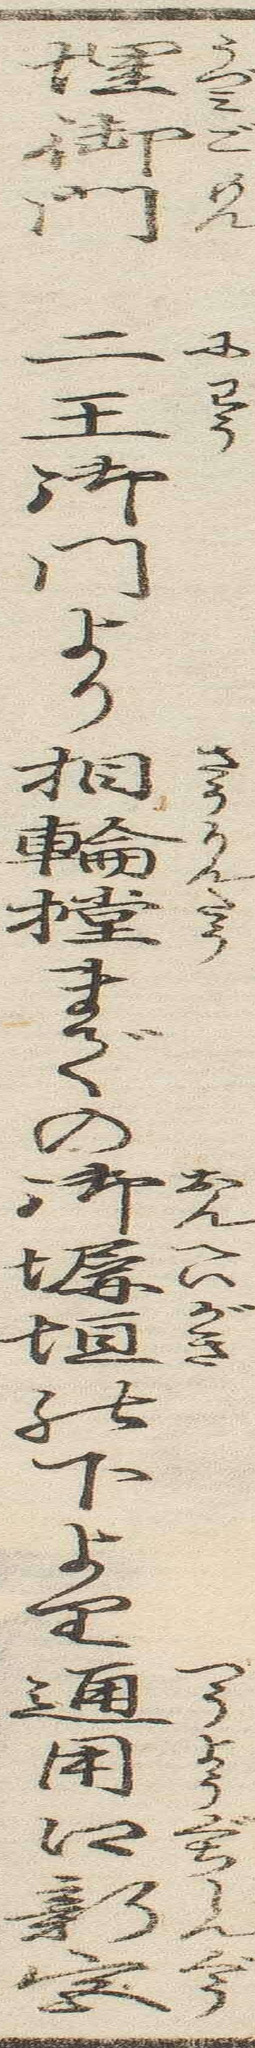埋御門二王御門より相輪樘までの御塀垣の下より通用口新宮
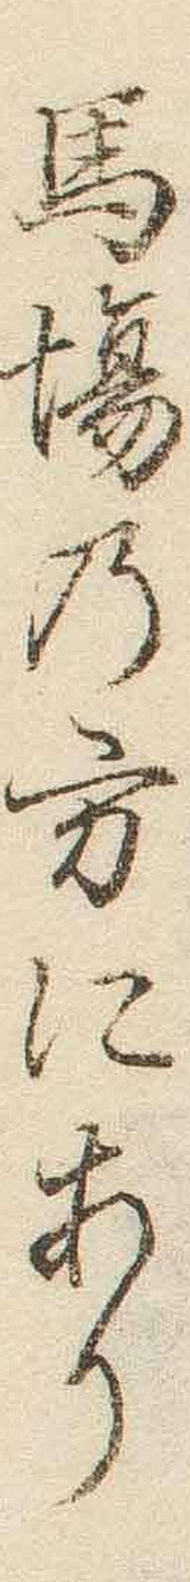馬塲の方にあり
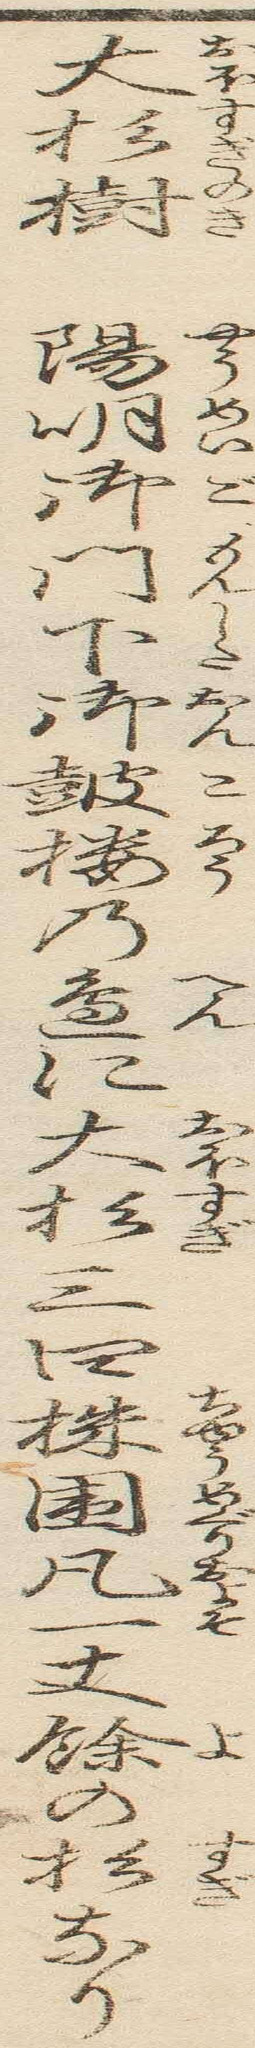大杉樹陽明御門下御皷楼の邊に大杉三四株圍凡一丈餘の杉なり
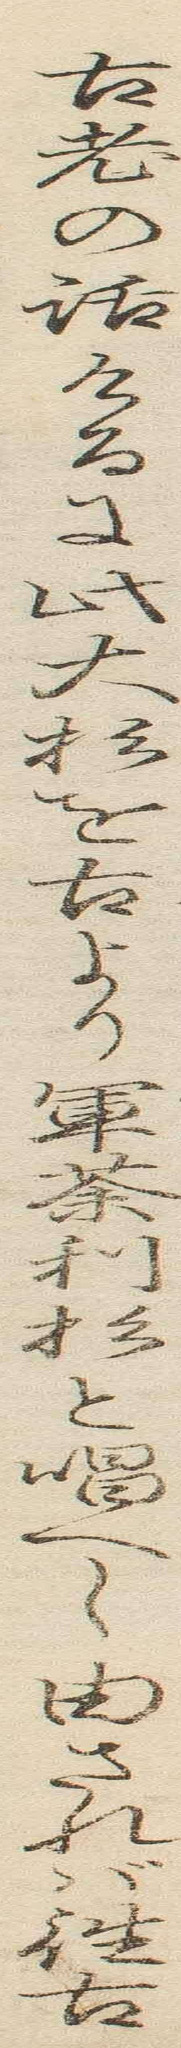古老の話けるに此大杉を古より軍荼利杉と唱へし由されば徃古
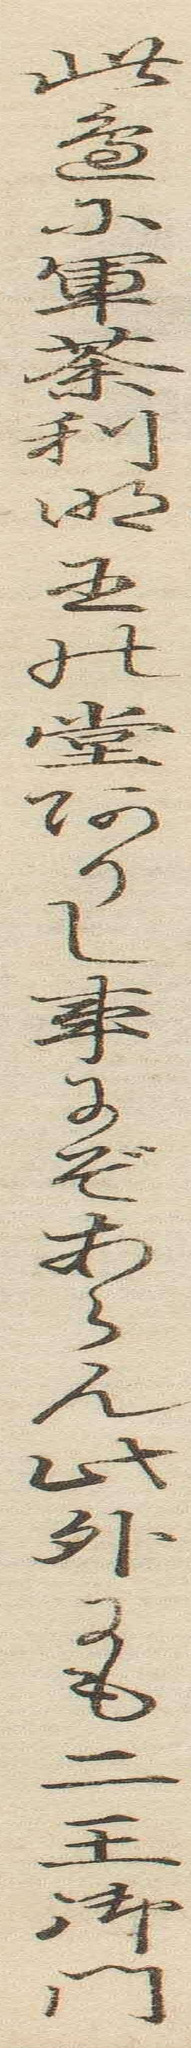此邊に軍荼利明王の堂ありし事にぞあらん此外にも二王御門
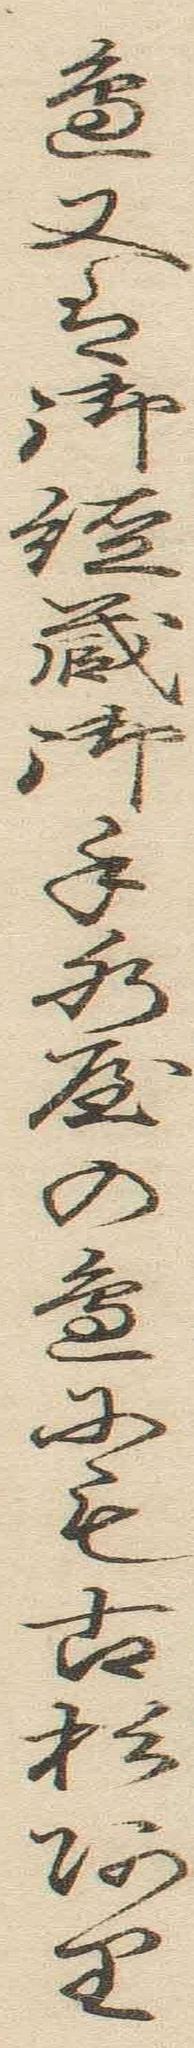邊又は御經蔵御手水屋の邊にも古杉あり

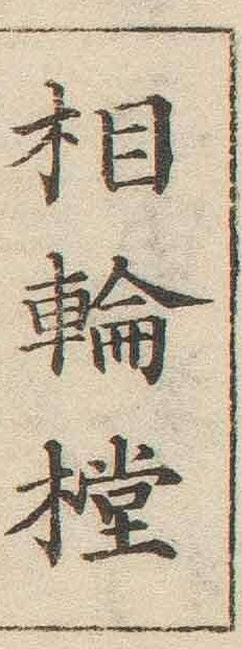相輪樘

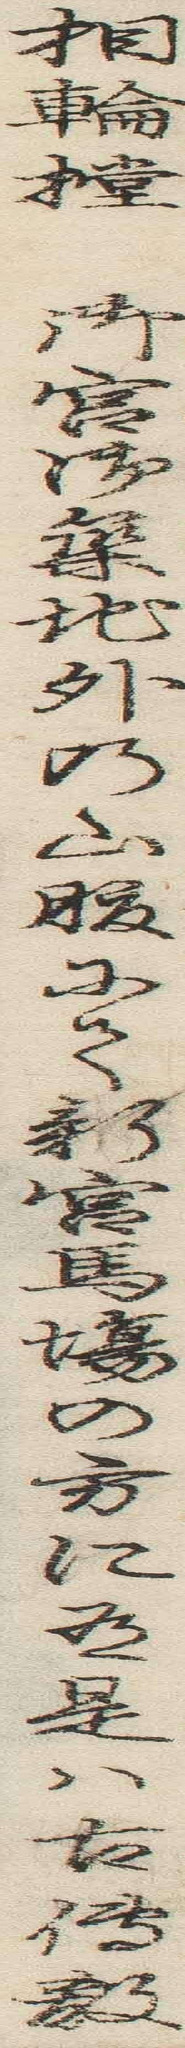相輪樘御宮御築地外の山腹にて新宮馬塲の方に有是は古傳敎
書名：日光山志
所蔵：東京学芸大学附属図書館 国文学研究資料館
